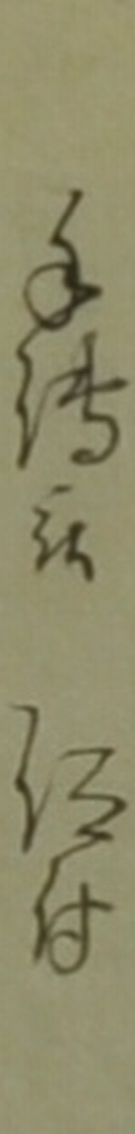手伝被仰付
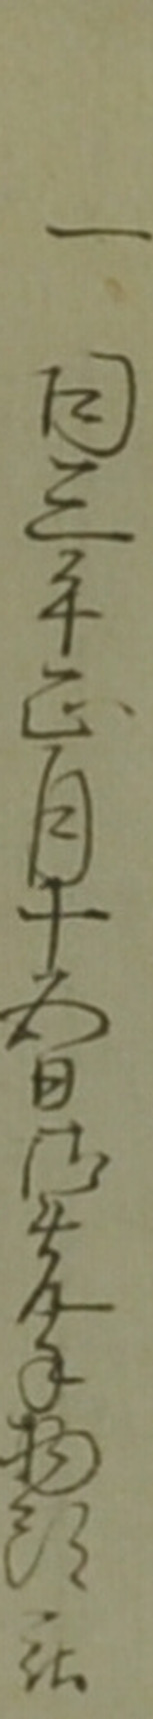一同三午正月十五日御先手物頭被
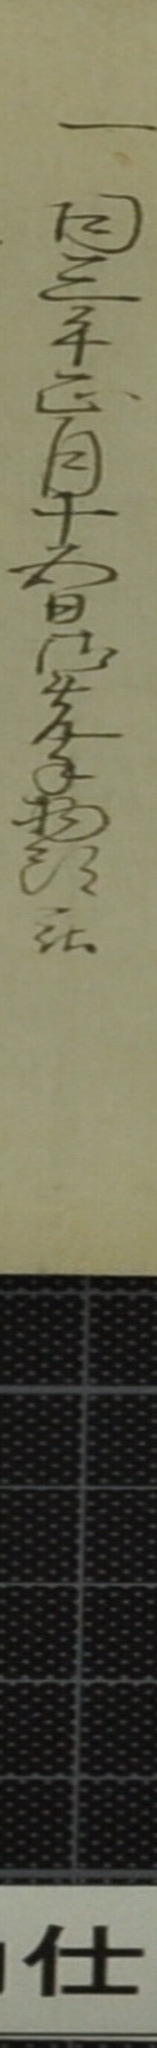一同三午正月十五日御先手物頭被
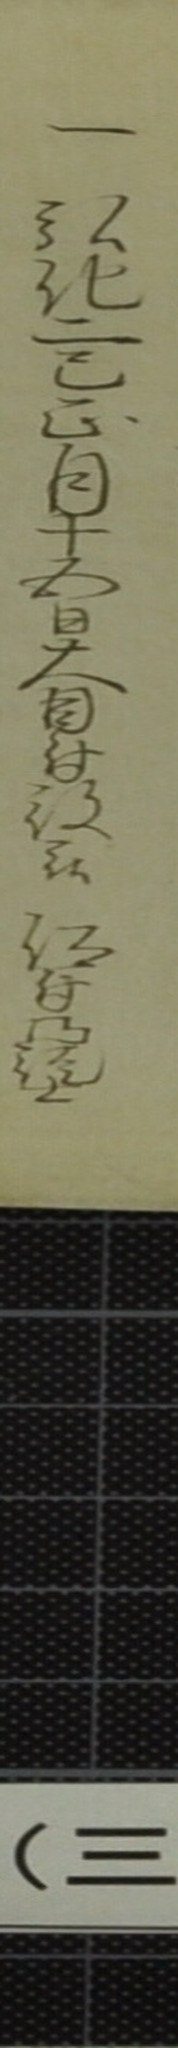一弘化二巳正月十五日大目付役被仰付御徒士
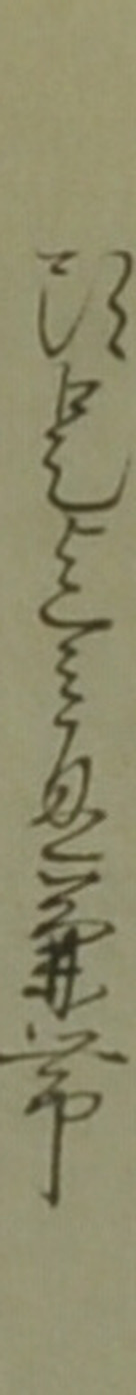頭是迄之通兼帯
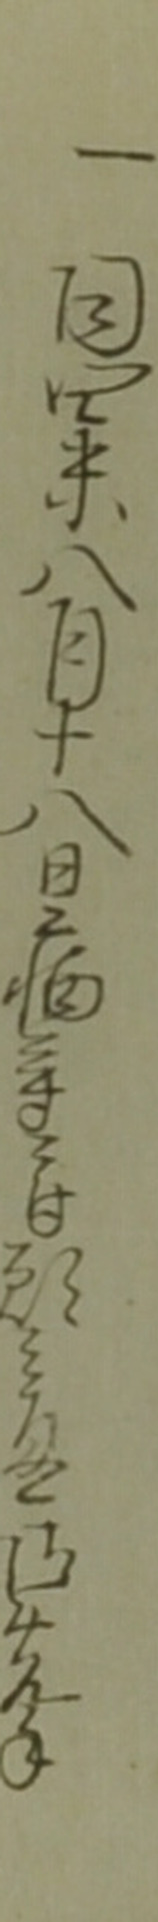一同四未八月十八日病気ニ付願之通御先手
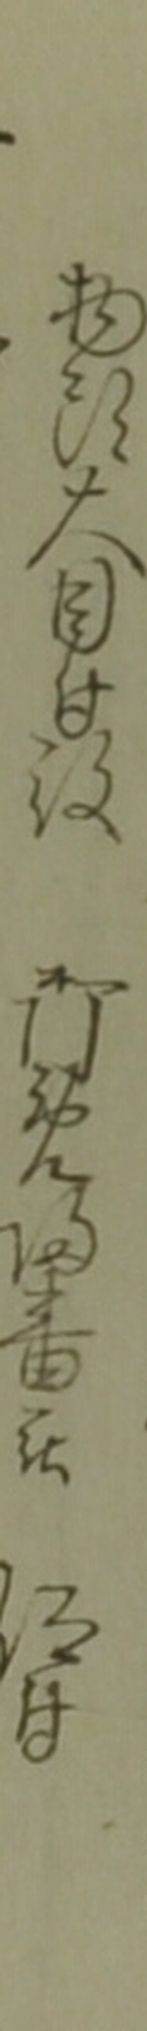物頭大目付役御免帰番被仰付
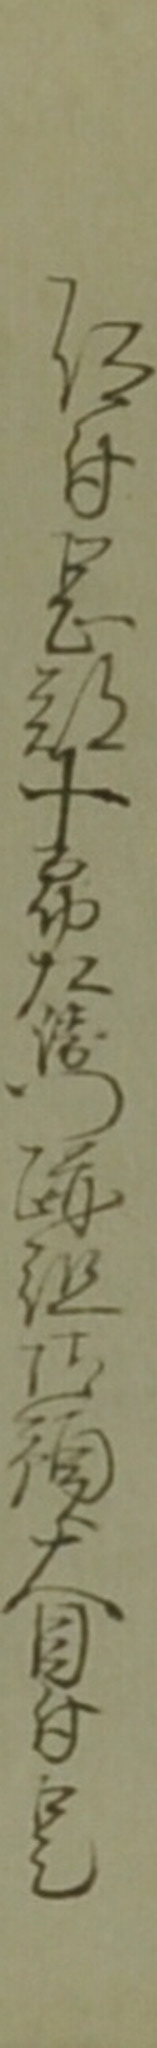仰付岡部十郎左衛門跡組御預大目付是
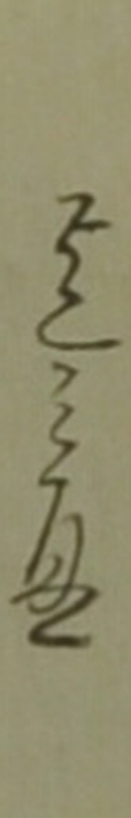迄之通
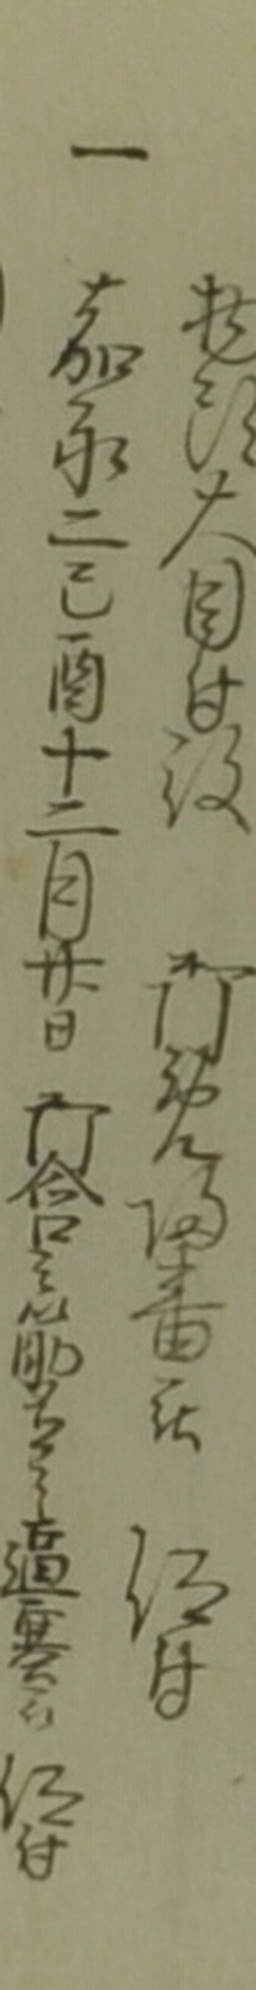一嘉永二己酉十二月廿日御含之筋有之逼塞被仰付
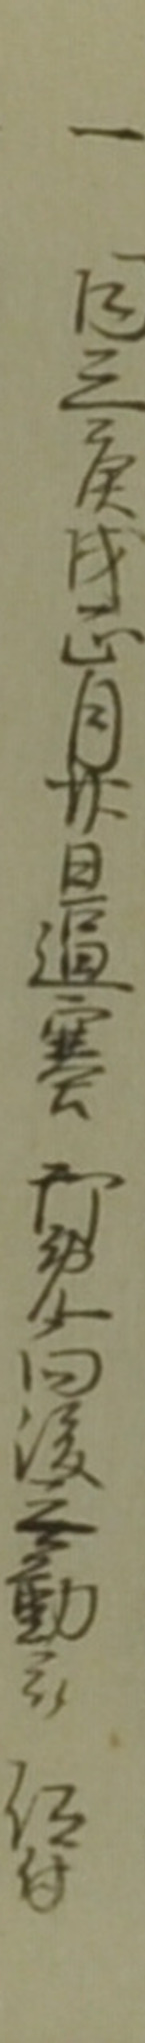一同三庚戌正月廿日逼塞御免向後無勤被仰付
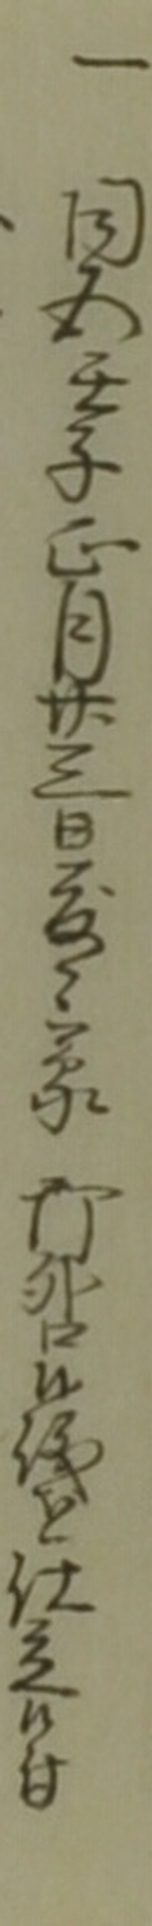一同五壬子正月廿三日度々蒙御咎候儀を仕立候付
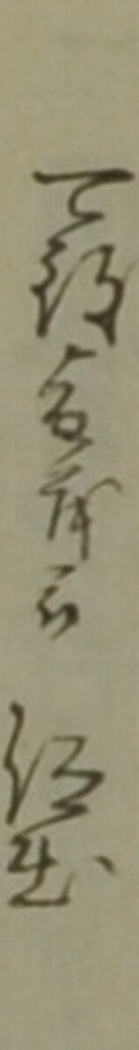可致旨茂被仰出
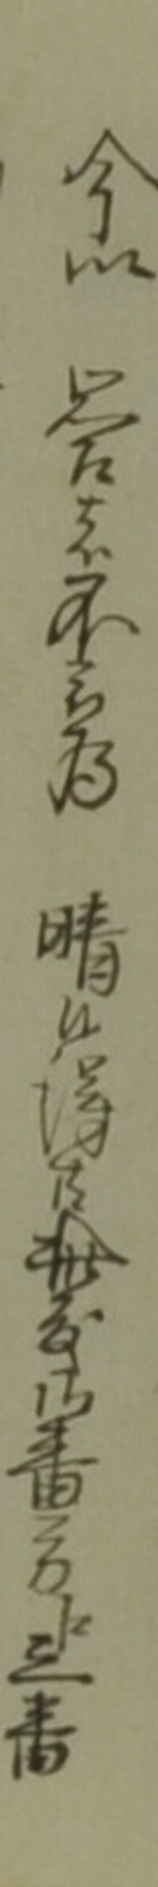今以思召者不被為晴候得共此度御番方江三番
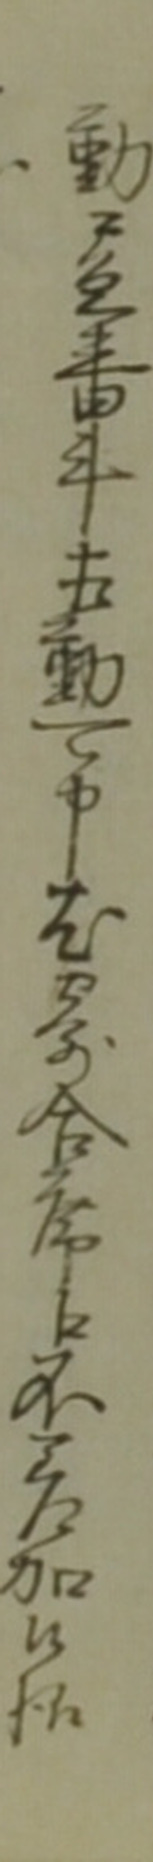勤昼番斗相勤可申尤寄合席江不差加候様
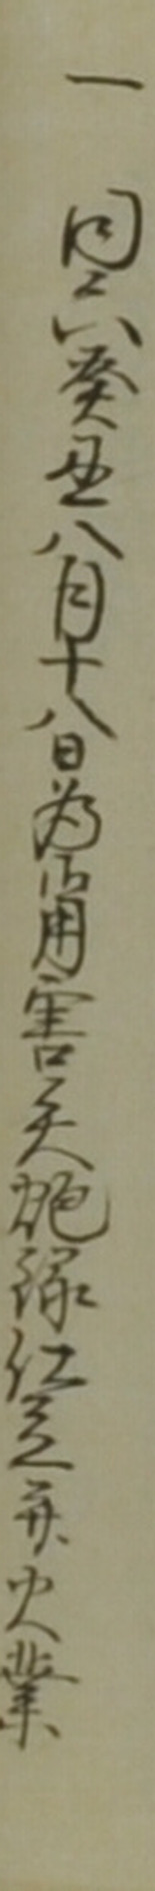一同六癸丑八月十八日為御用害矢炮録仕立并火業
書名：給人諸士勤仕録（三）
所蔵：伊那市立高遠町図書館・合同会社AMANE
